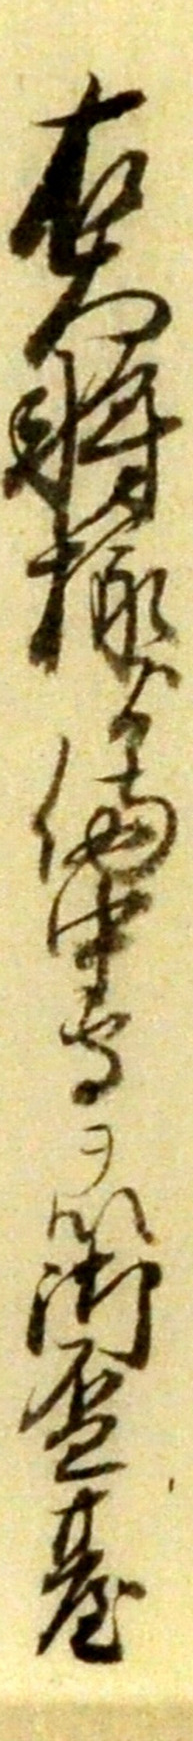右大将様ゟ備中守ヲ以御盃台
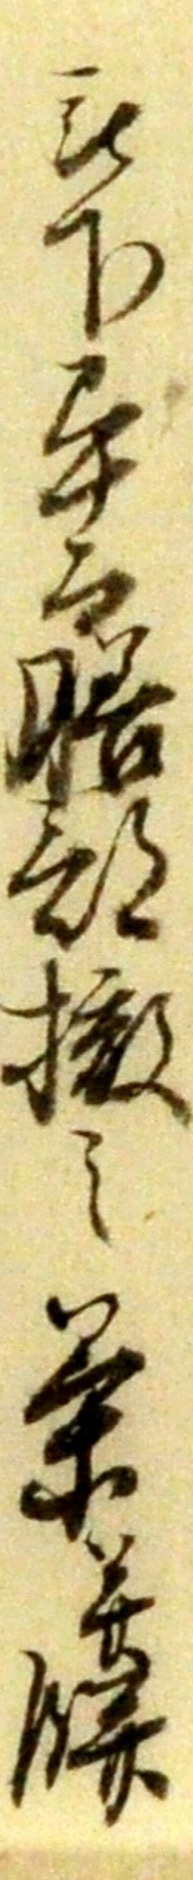被下畢而膳部撤之茶并餅
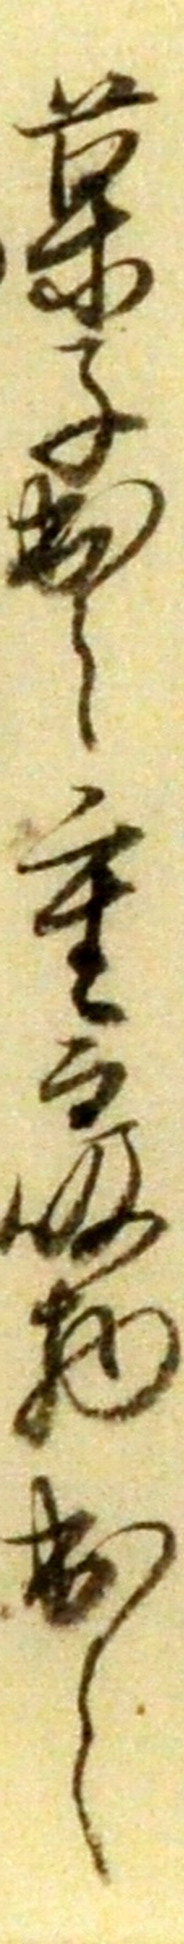菓子出之重而吸物出之
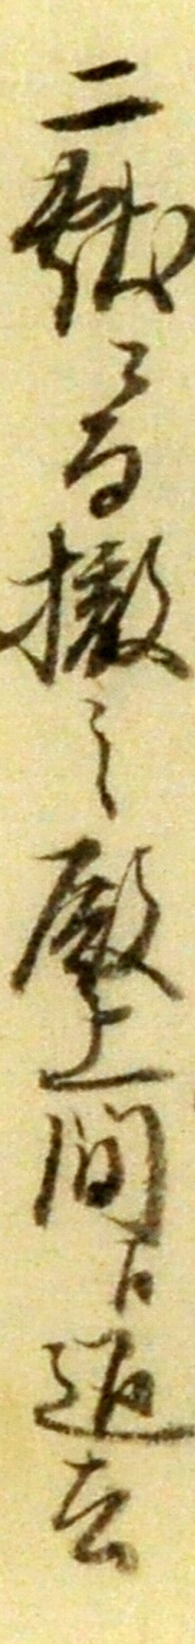二献ニ而撤之殿上間え退去

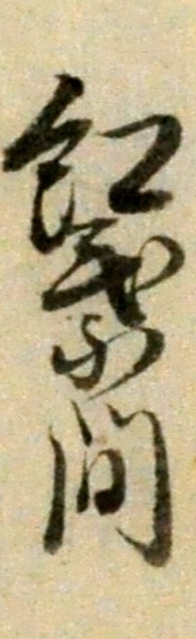紅葉間
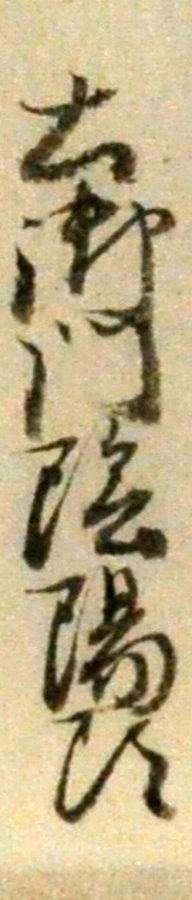土御門陰陽頭
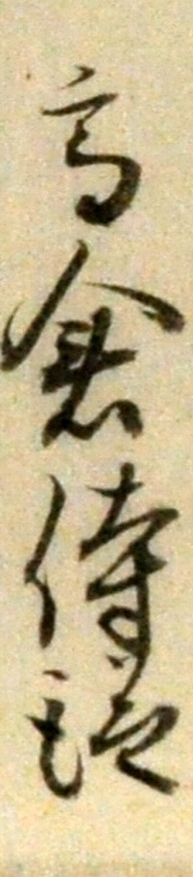高倉侍従
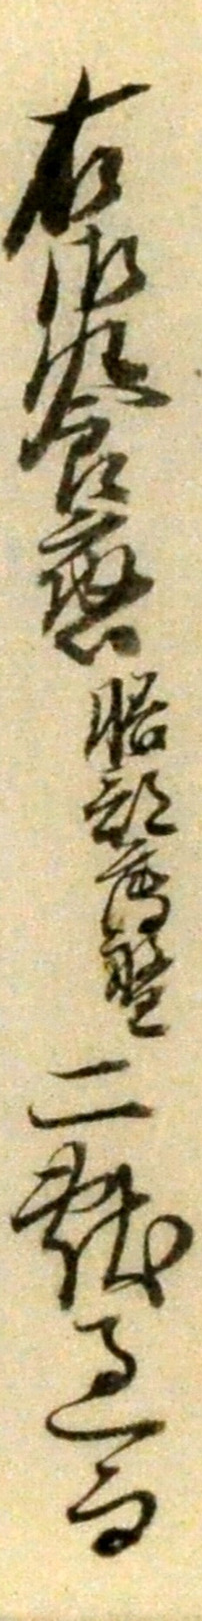右御饗応膳部薄盤二献過而
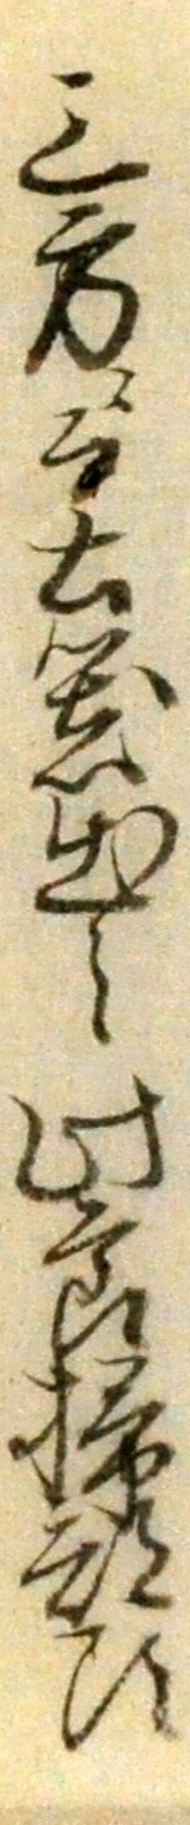三方ニ而土器出之此節掃部頭
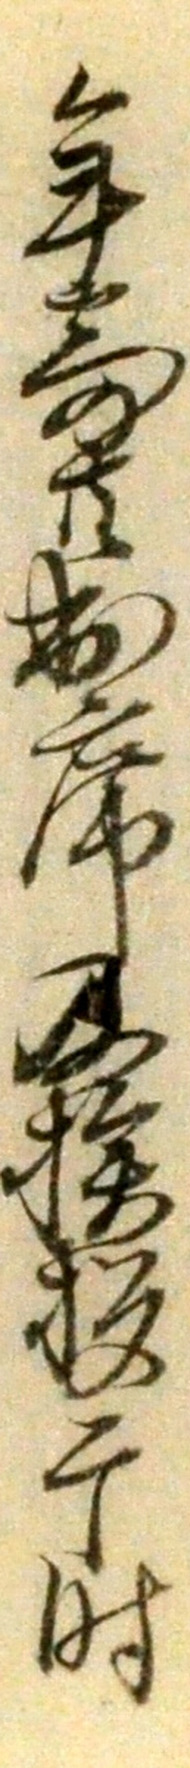年寄共出席及挨拶于時
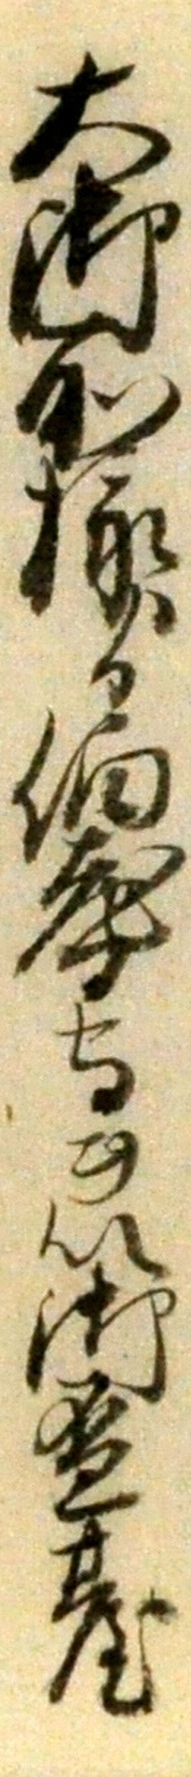大御所様ゟ伯耆守ヲ以御盃台
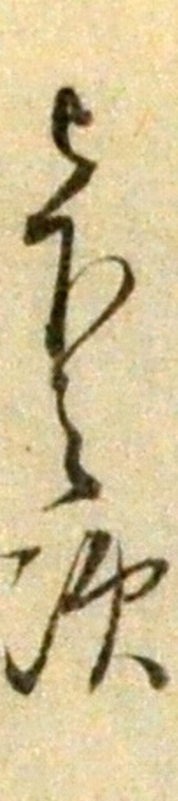被下之次
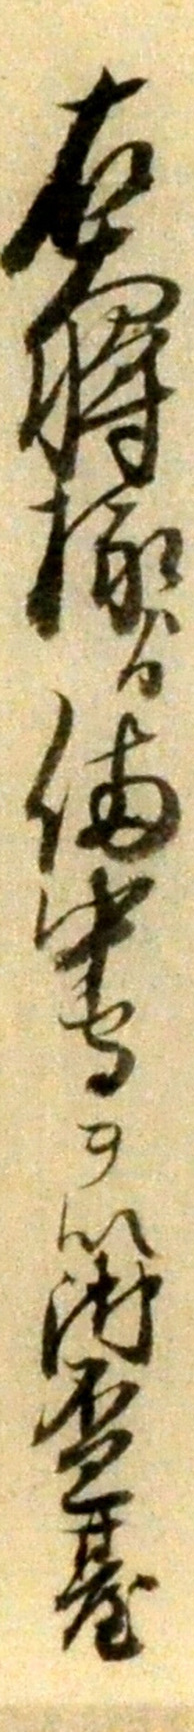右大将様ゟ備中守ヲ以御盃台
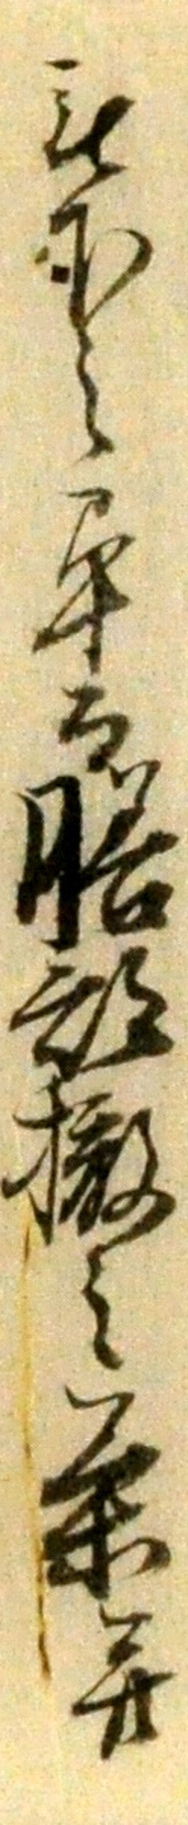被下之畢而膳部撤之茶并
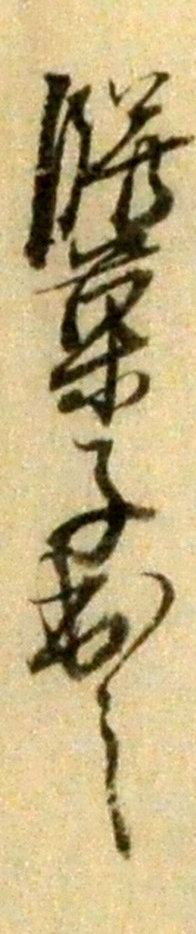餅菓子出之
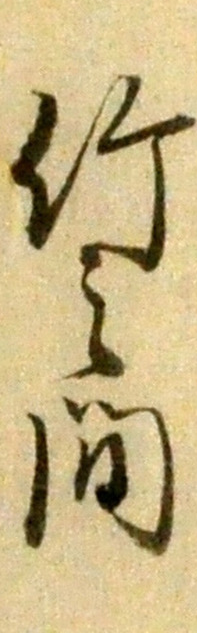竹之間
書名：御馳走御能ノ節ノ留外
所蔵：伊那市立高遠町図書館・合同会社AMANE
